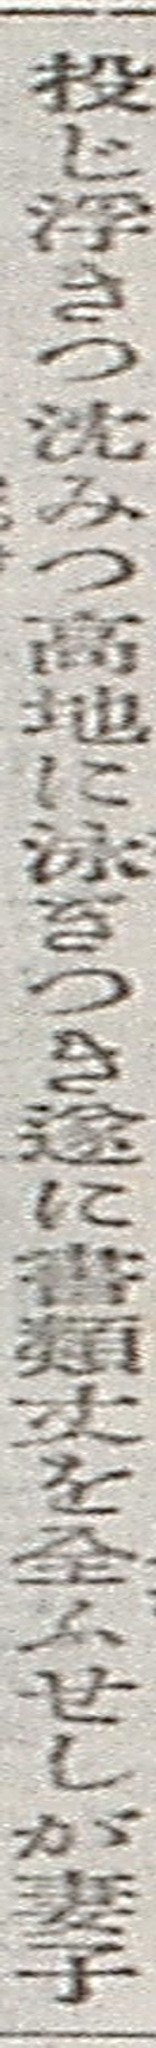投じ浮きつ沈みつ高地に泳ぎつき遂に書類丈を全ふせしが妻子
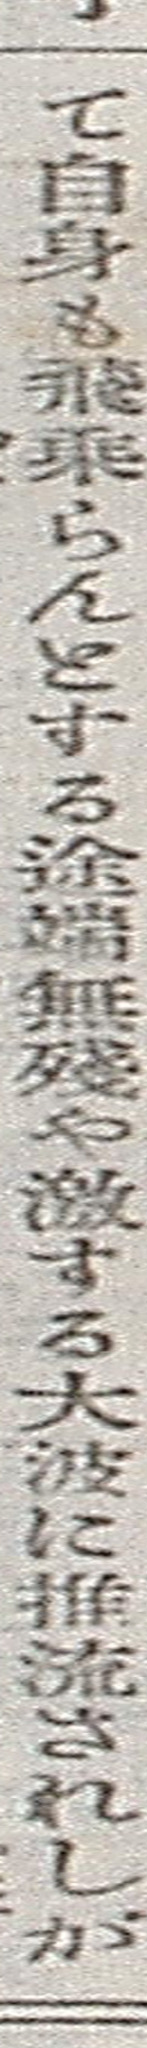て自身も飛乗らんとする途端無残や激する大波に推流されしが
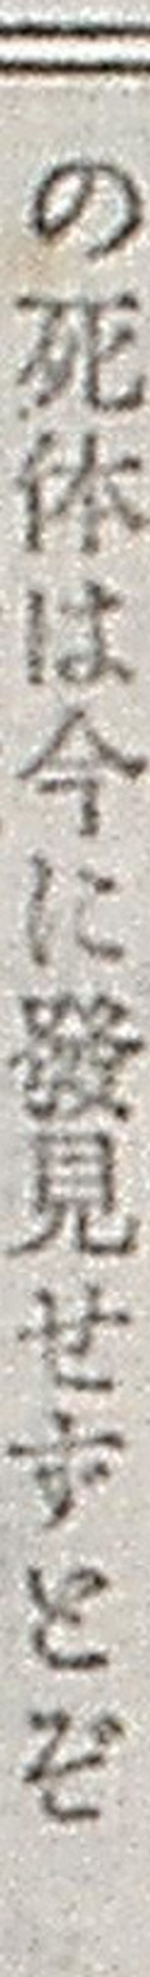の死体は今に発見せずとぞ
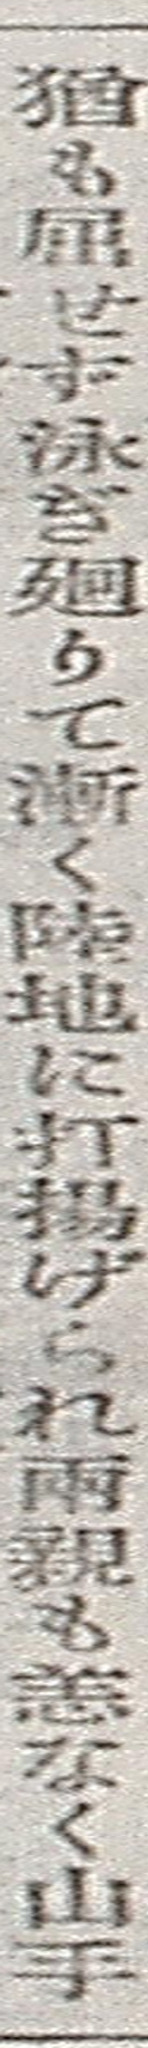猶も屈せず泳ぎ廻りて漸く陸地に打揚げられ両親も恙なく山手
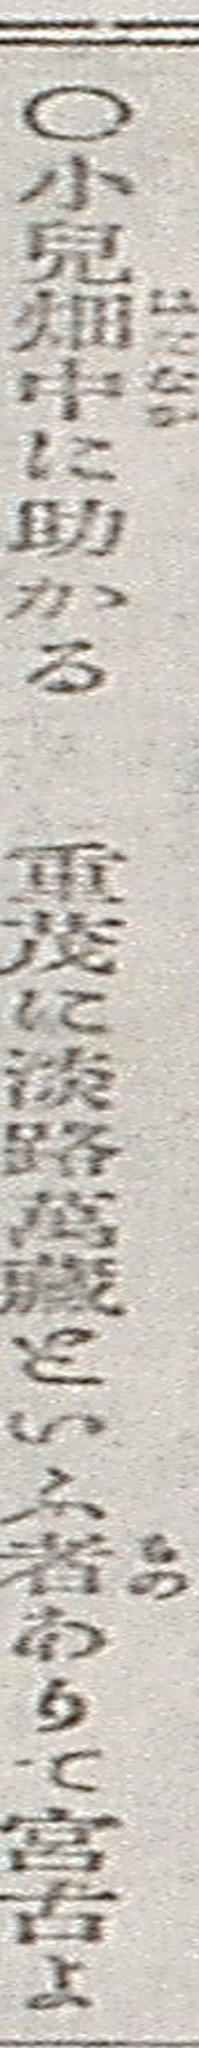○小兒畑中に助かる重茂に淡路萬蔵といふ者ありて宮古よ
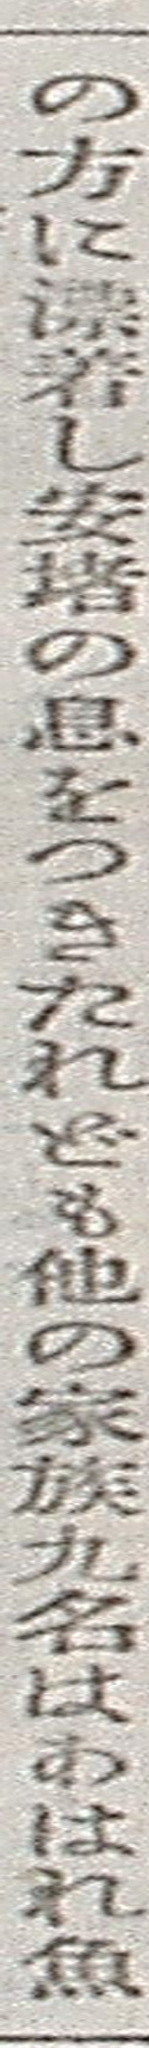の方に漂着し安堵の息をつきたれども他の家族九名はあはれ魚
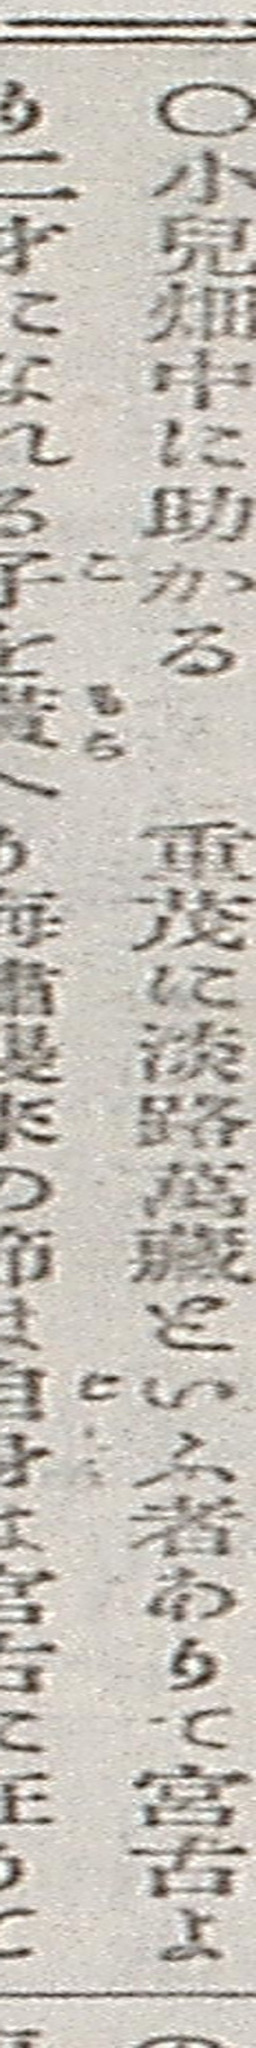り二才になれる子を貰へり海嘯襲来の節は自身は宮古に在りて
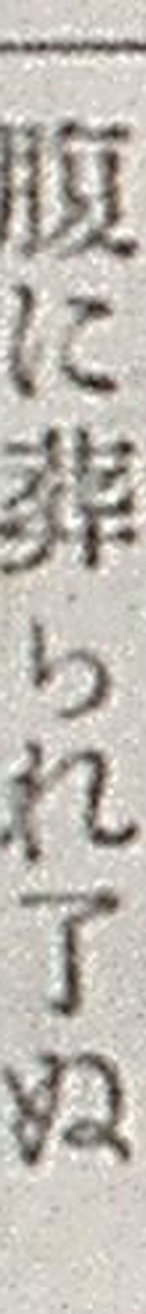腹に葬られ了ぬ
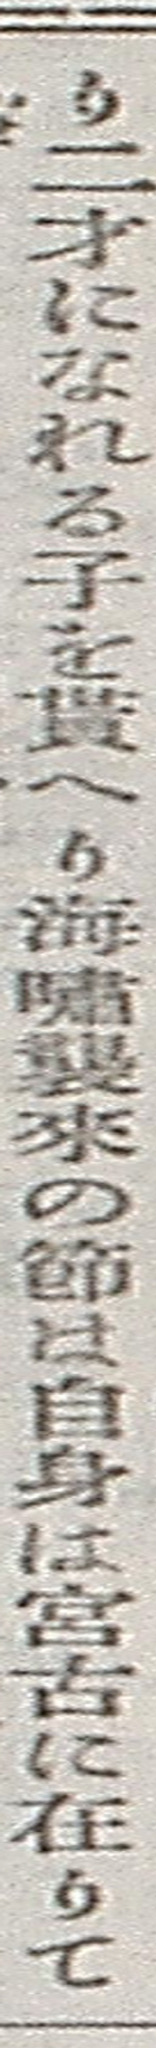り二才になれる子を貰へり海嘯襲来の節は自身は宮古に在りて
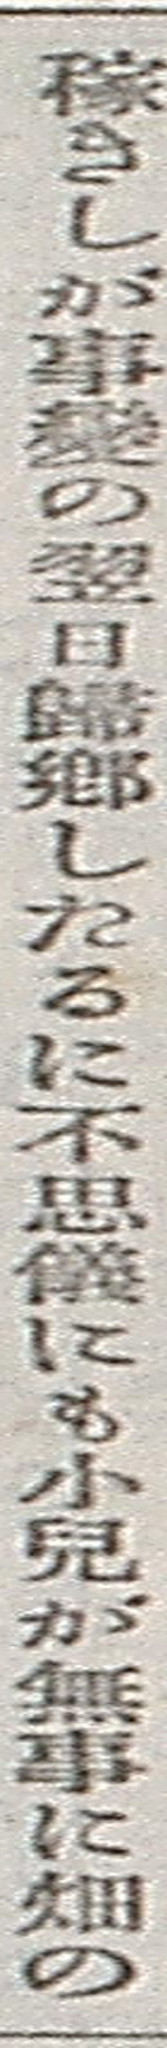稼ぎしが事変の翌日帰郷したるに不思儀にも小兒が無事に畑の
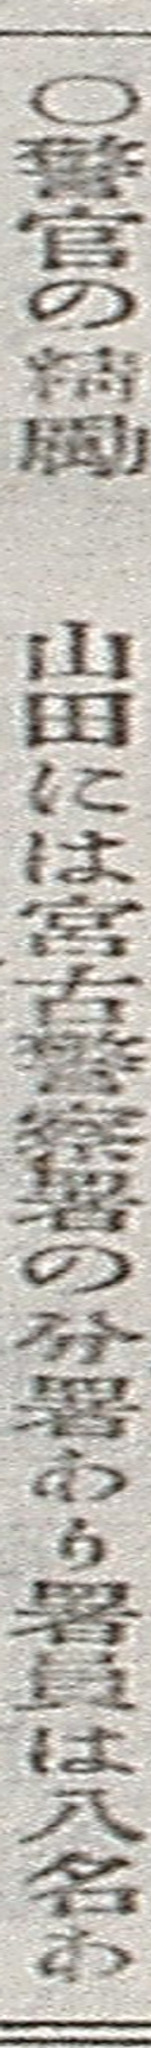○警官の精励山田には宮古警察署の分署あり署員は八名あ
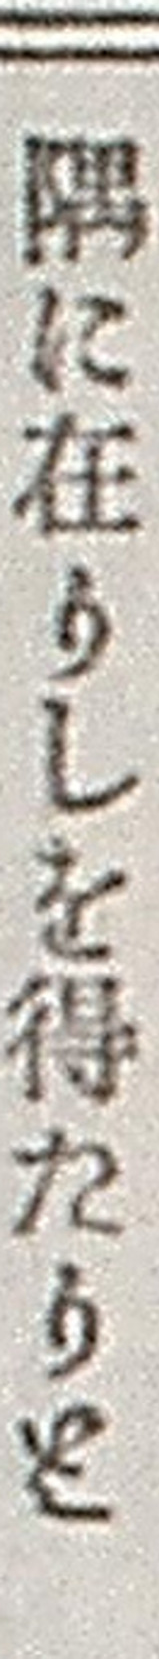隅に在りしを得たりと
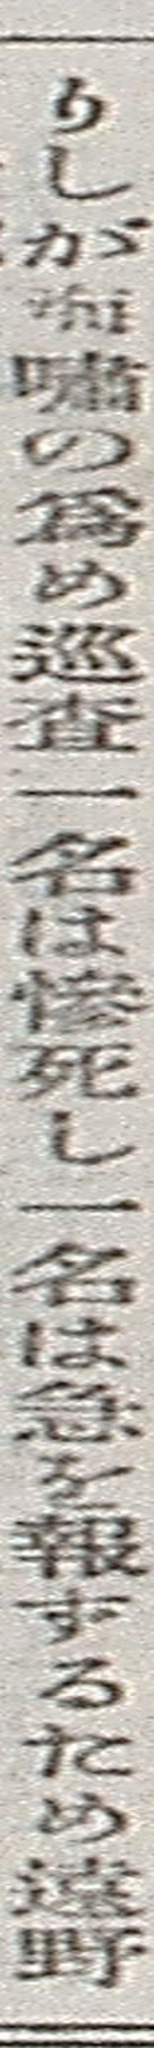りしが海嘯の為め巡査一名は惨死し一名は急を報ずるため遠野
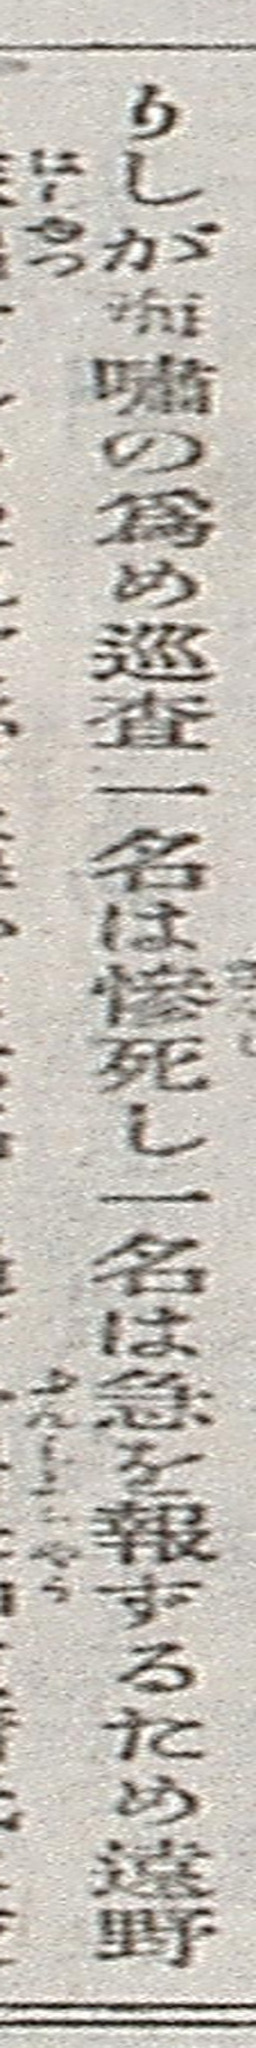りしが海嘯の為め巡査一名は惨死し一名は急を報ずるため遠野
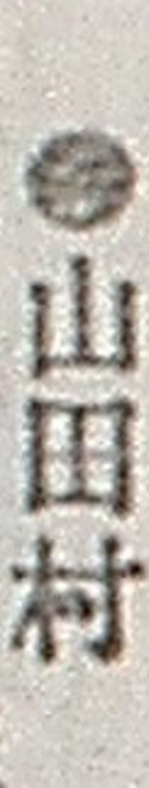●山田村
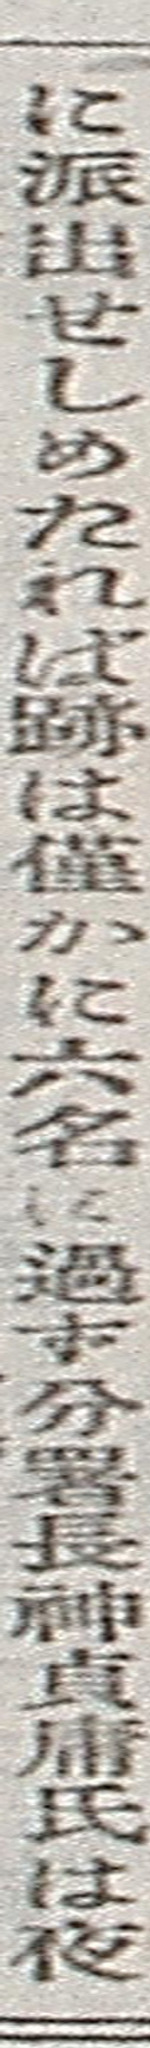に派出せしめたれば跡は僅かに六名に過ず分署長神貞庸氏は夜
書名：風俗畫報臨時増刊第百二十號　大海嘯被害録（下）
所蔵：東京大学地震研究所図書室 Earthquake Research Institute Library, The University of Tokyo, JAPAN
